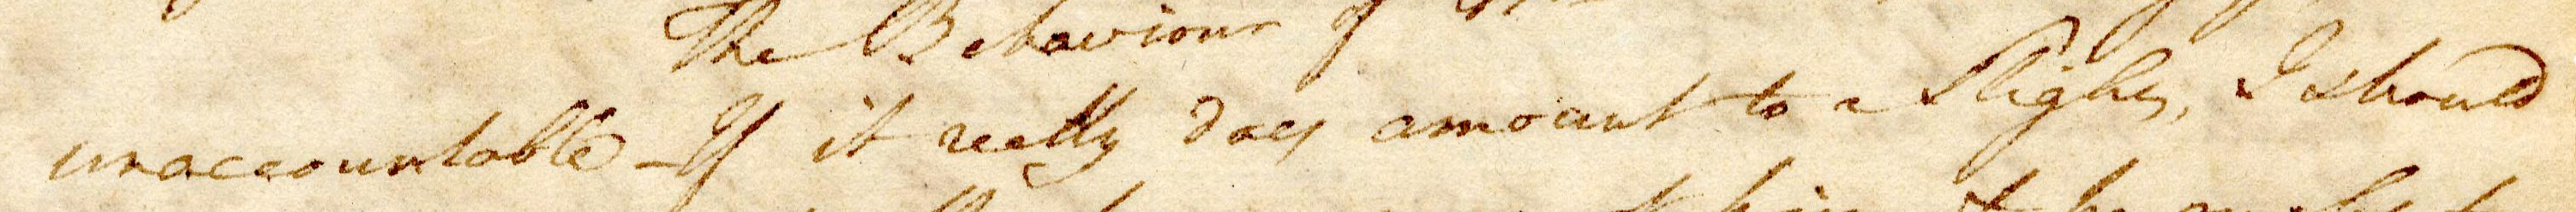unaccountable. If it really does amount to a Slight, I should
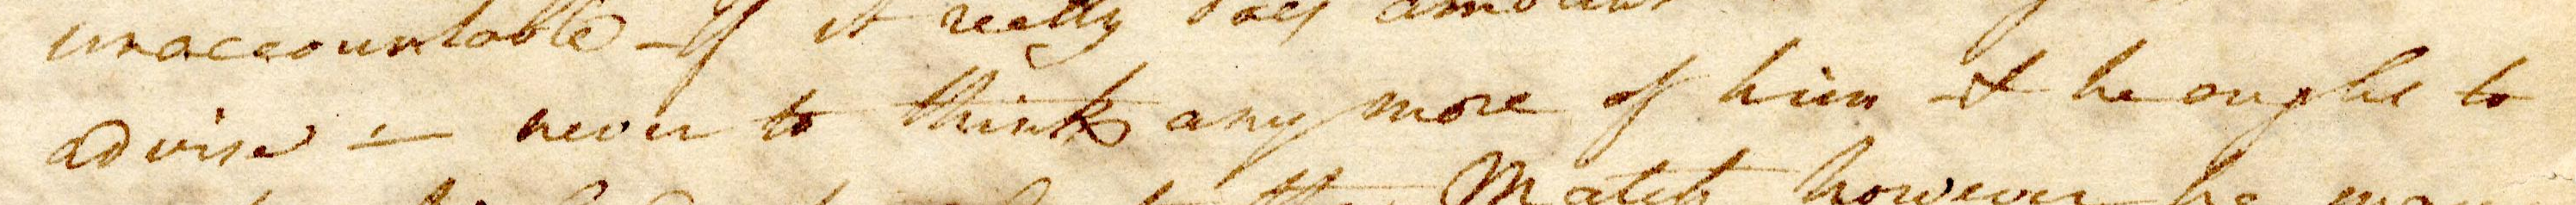advise- never to think any more of him & he ought to
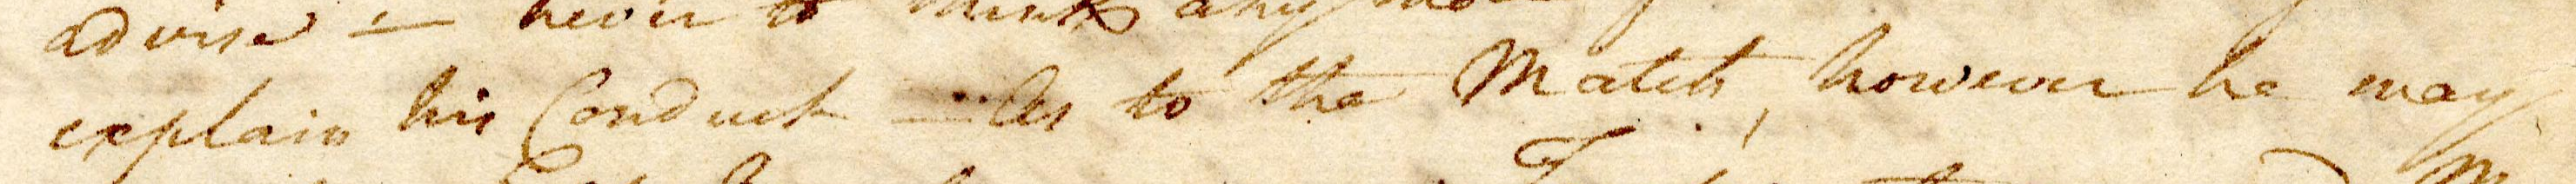explain his Conduct. As to the Match however he may
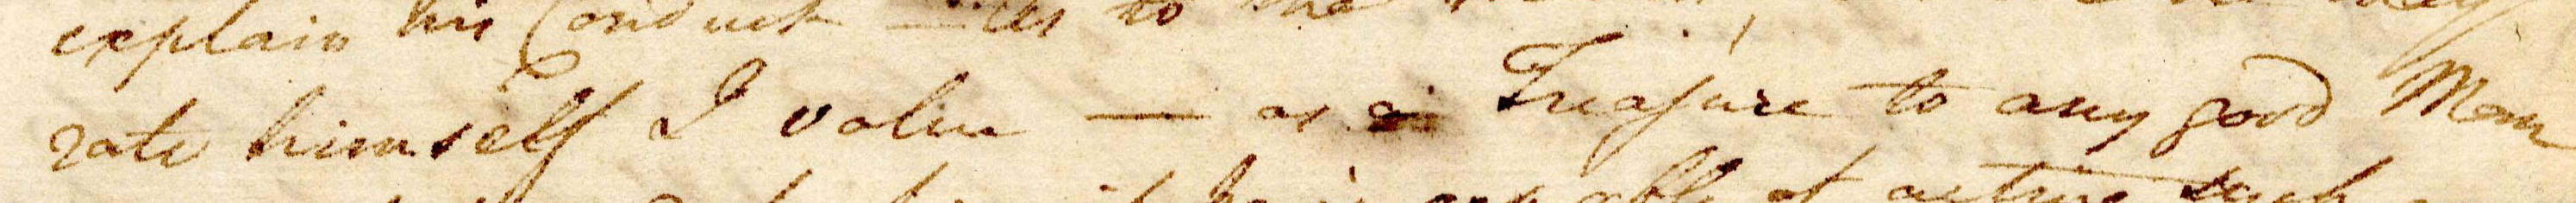rate himself I value– as Treasure to any good Man
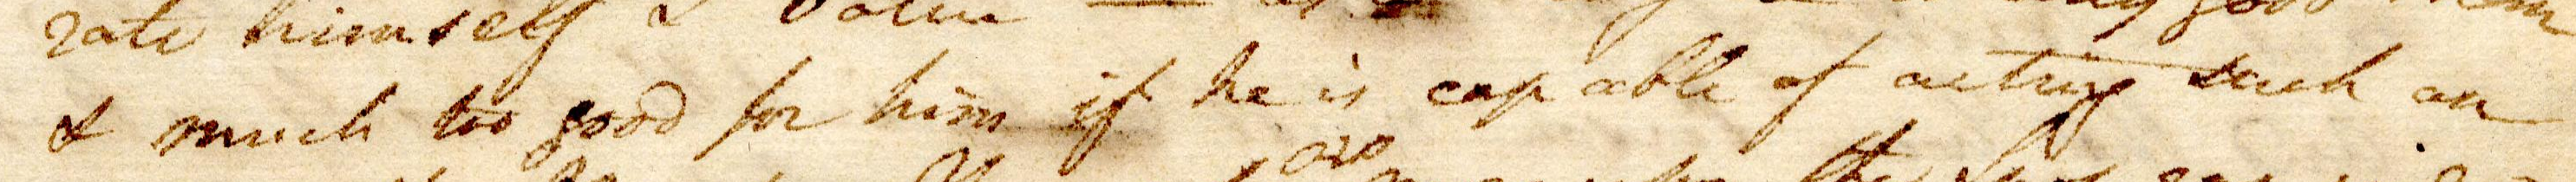& much too good for him if he is capable of acting such an
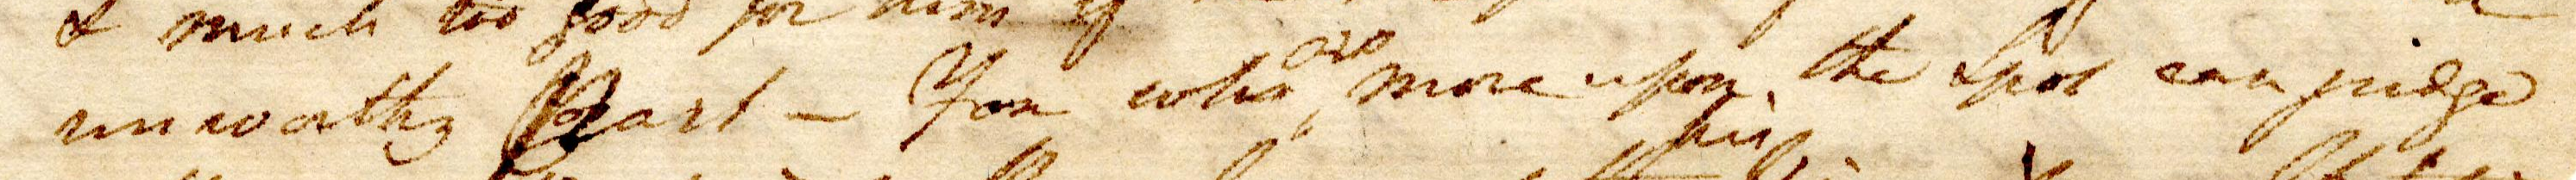unworthy Part. You who^se more open, the Spot can judge
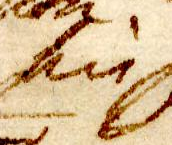his
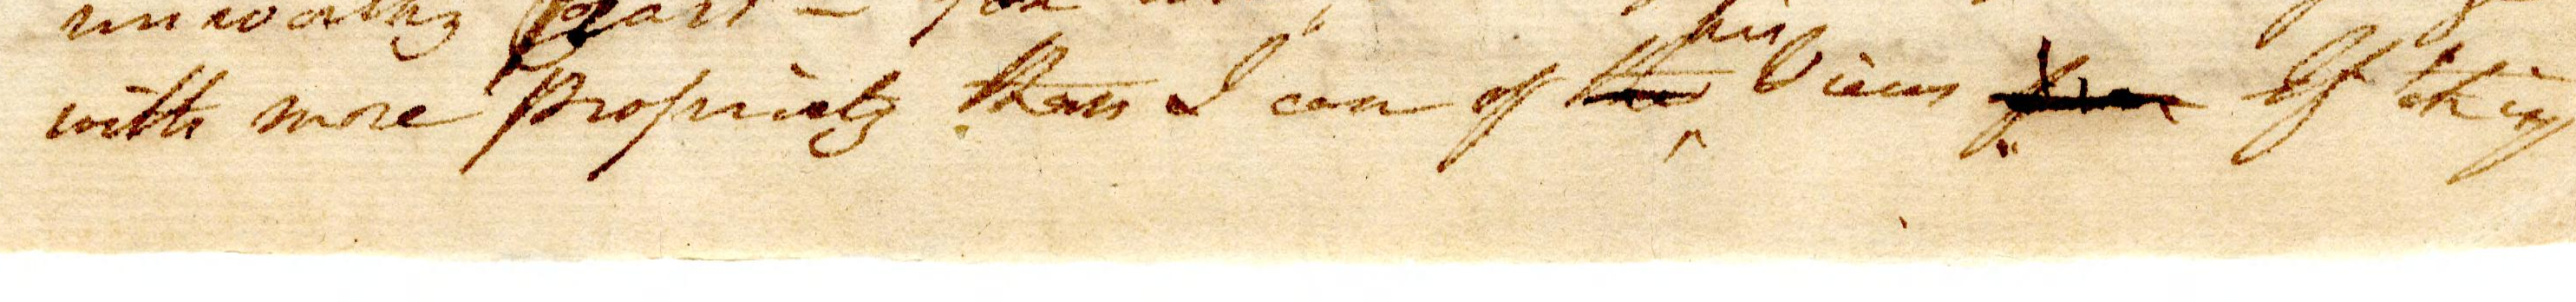with more propriety, than I can of the ^ Views four If they
